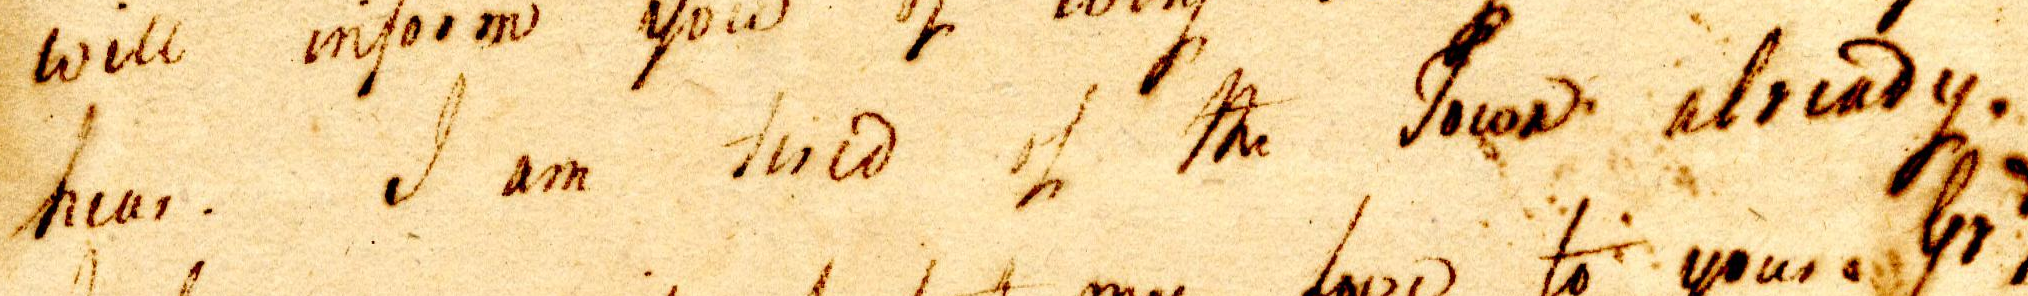hear. I am tired of the Town already.
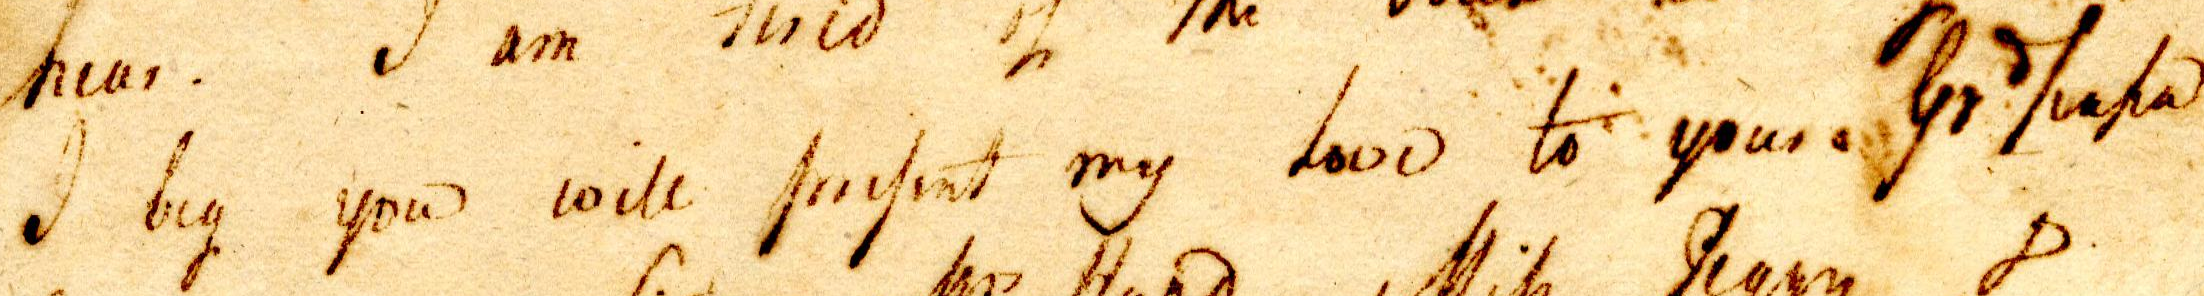I beg you will present my Love to your Gr^d papa
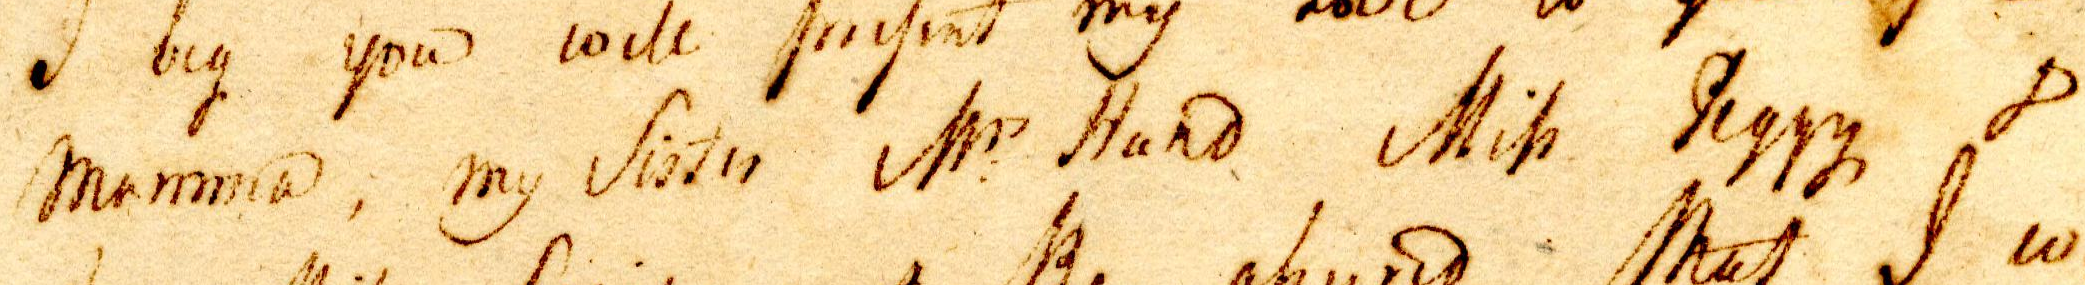momma, my Sister M^rs. Hand Miss Peggy &
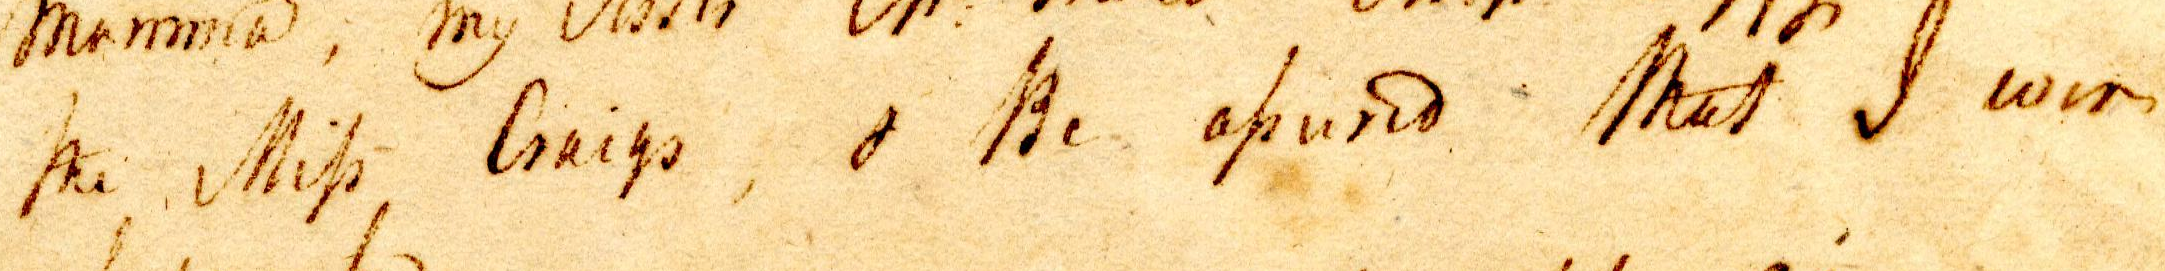the Miss Craigs, & Be assured that I ever
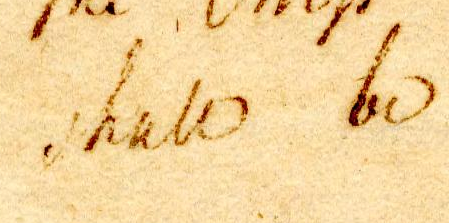shall be
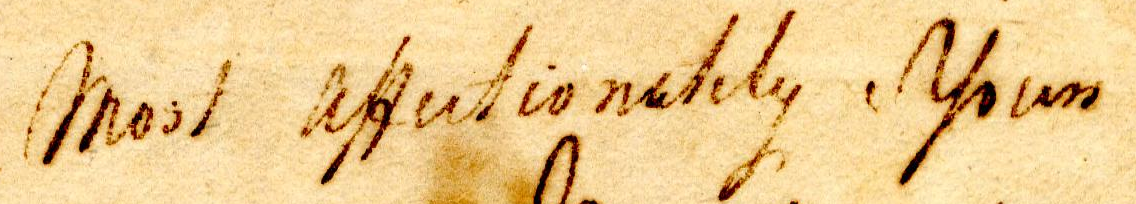Most affectionately Yours
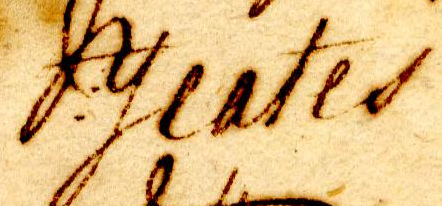J. Yeates
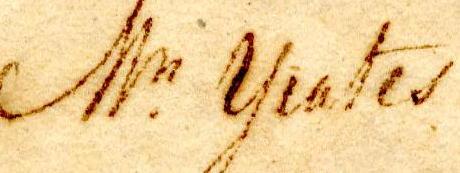M^r. Yeates.
